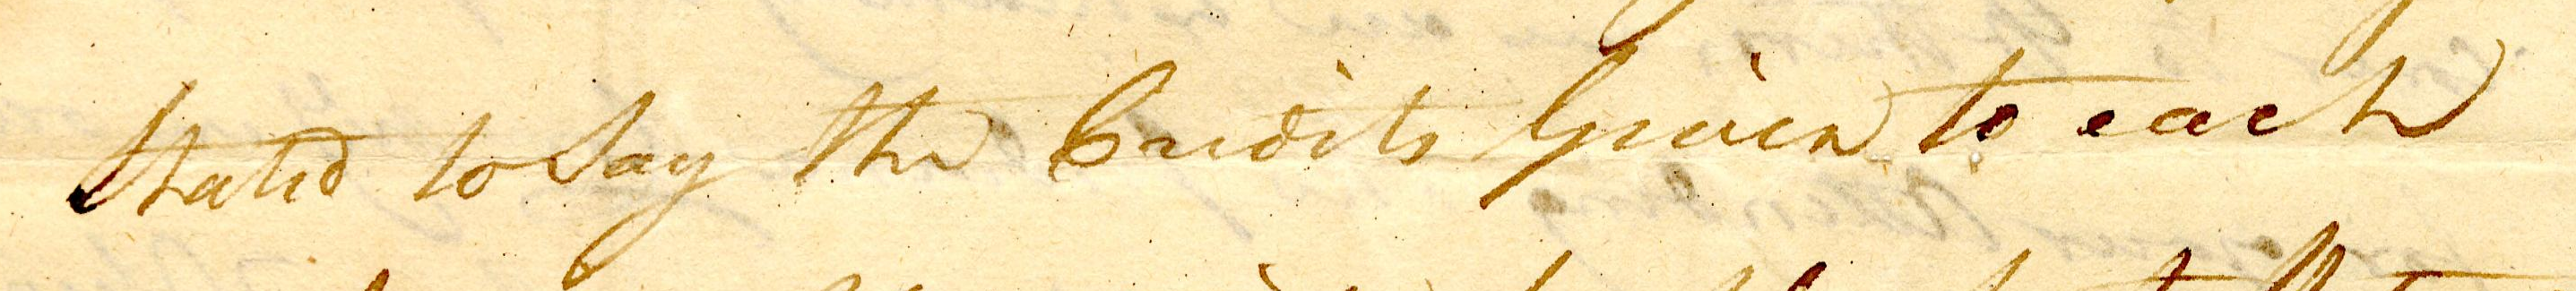Stated to Say the credits Given to each
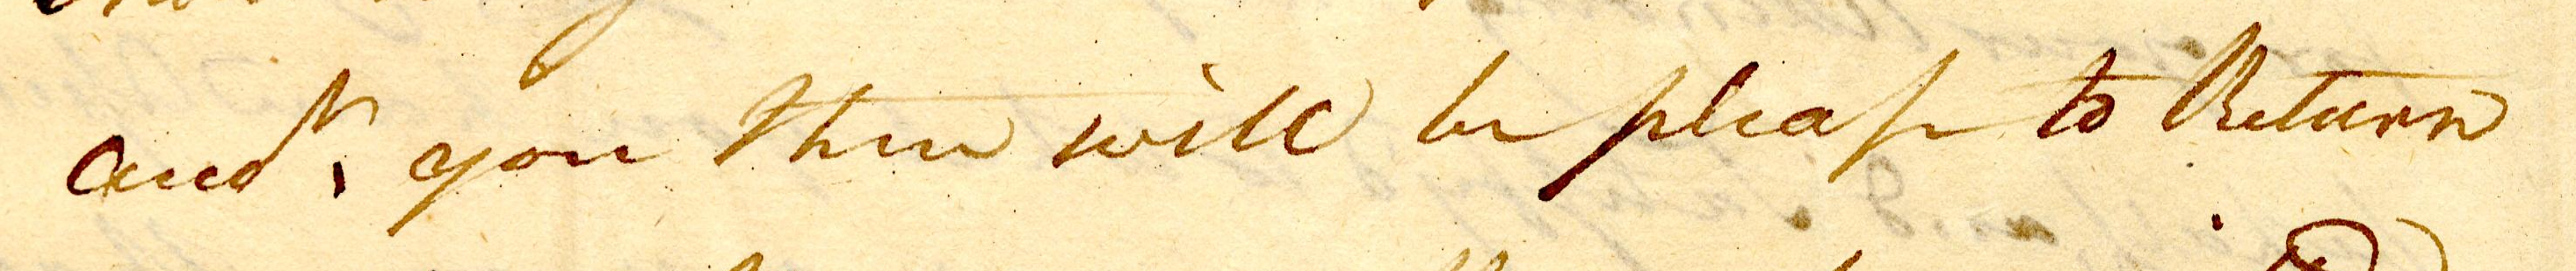acco^t. you there will be please to Return
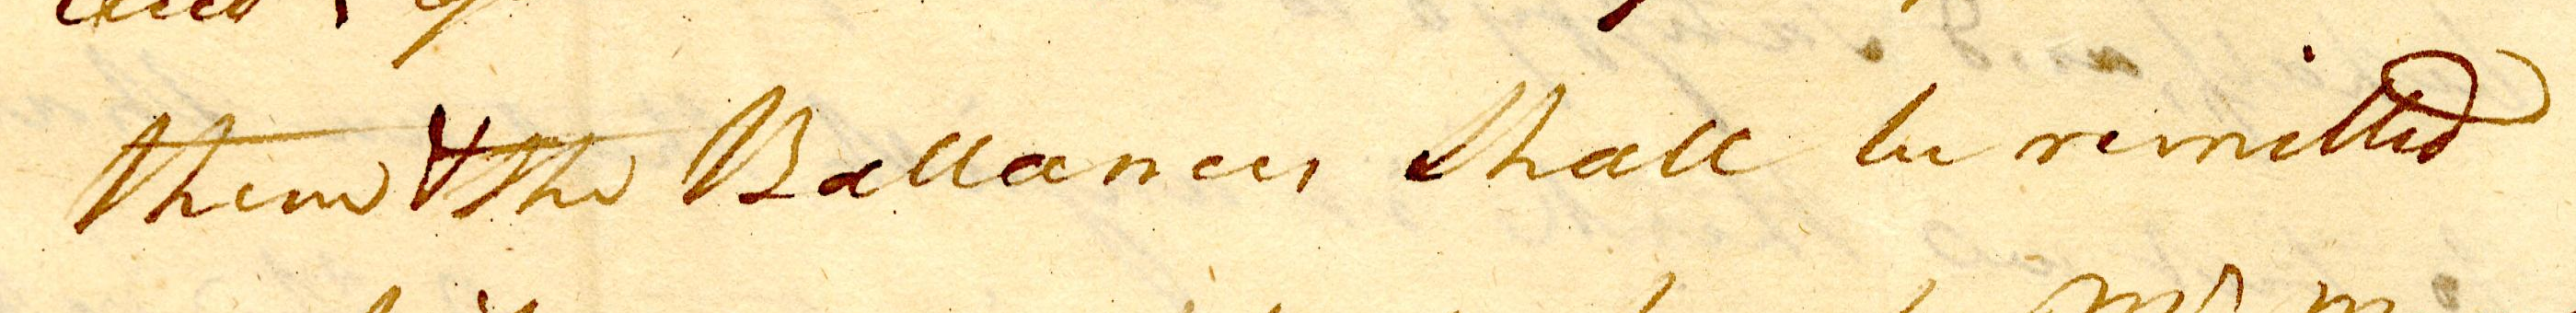themhs Ballances Shall be remitted
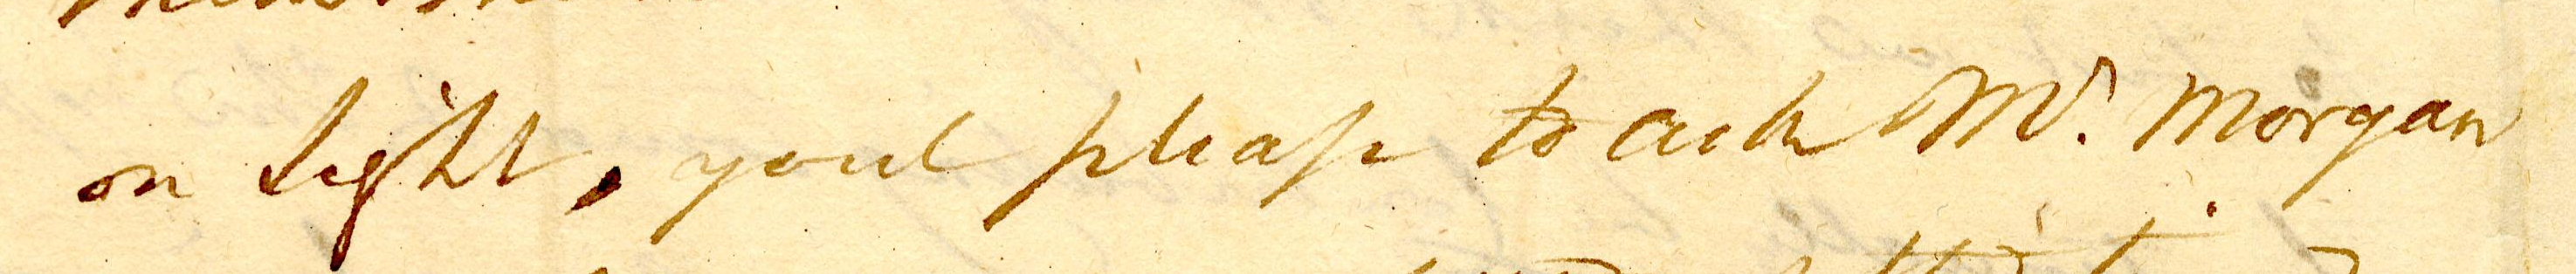on Sight, youl please to ask M^r. Morgan
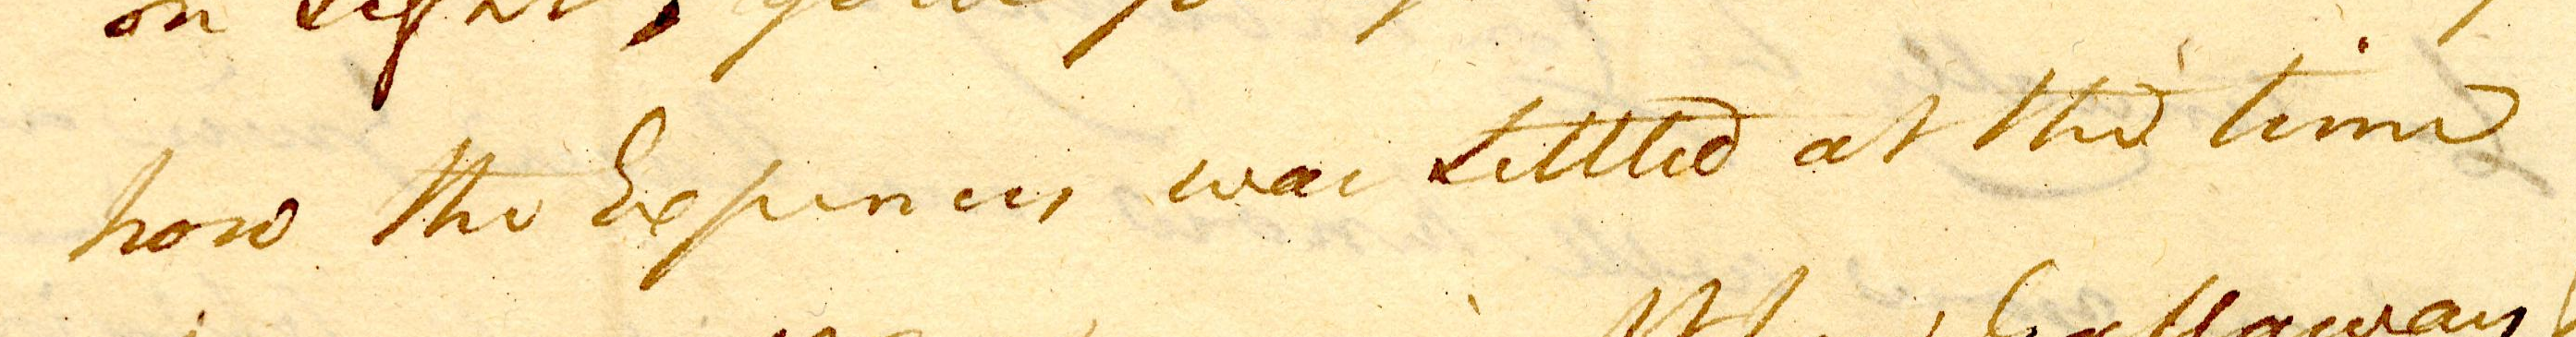how the Expences was settled at the time
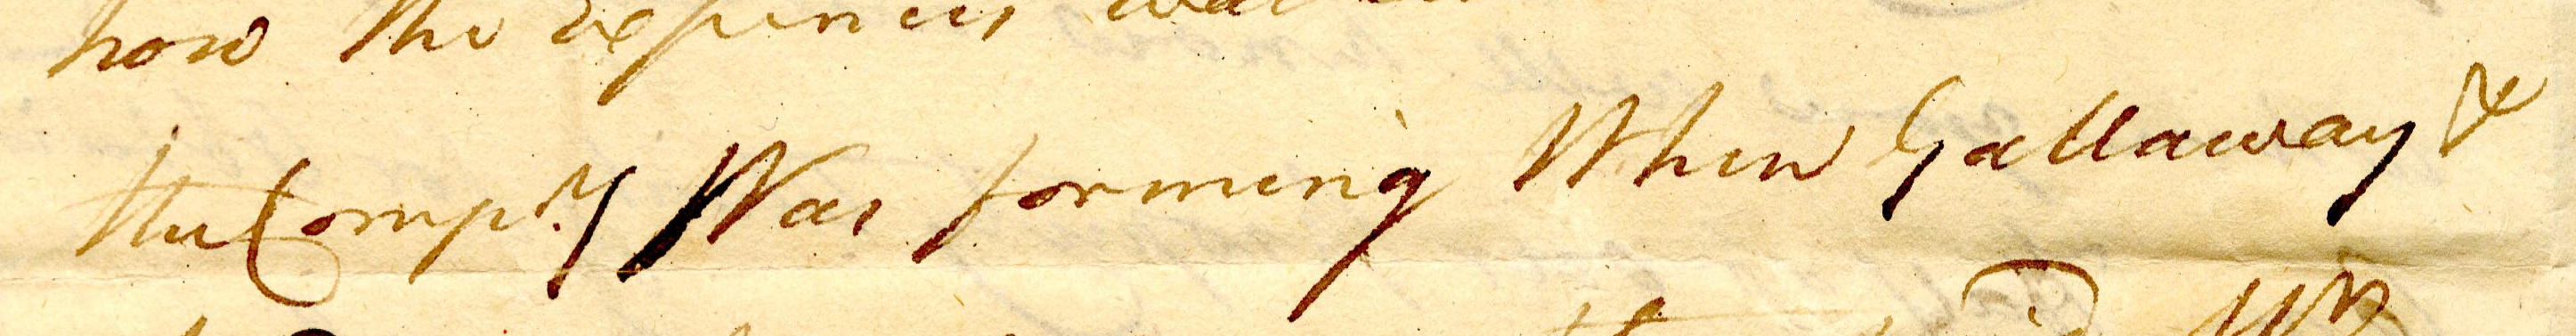the Com^y. was forming When Gallaway &
